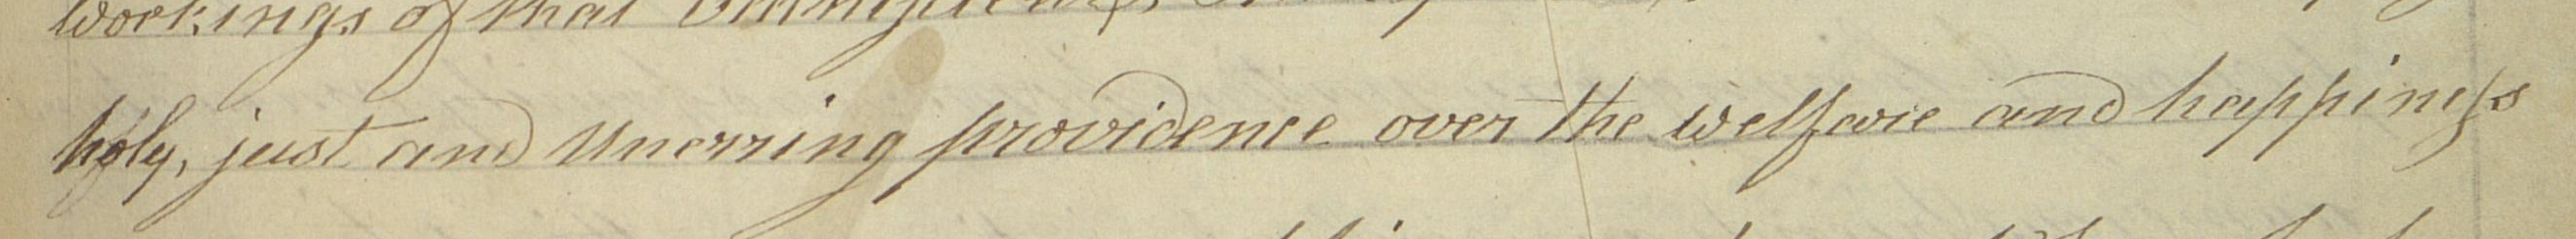holy, just and Unerring providence over the welfare and happiness
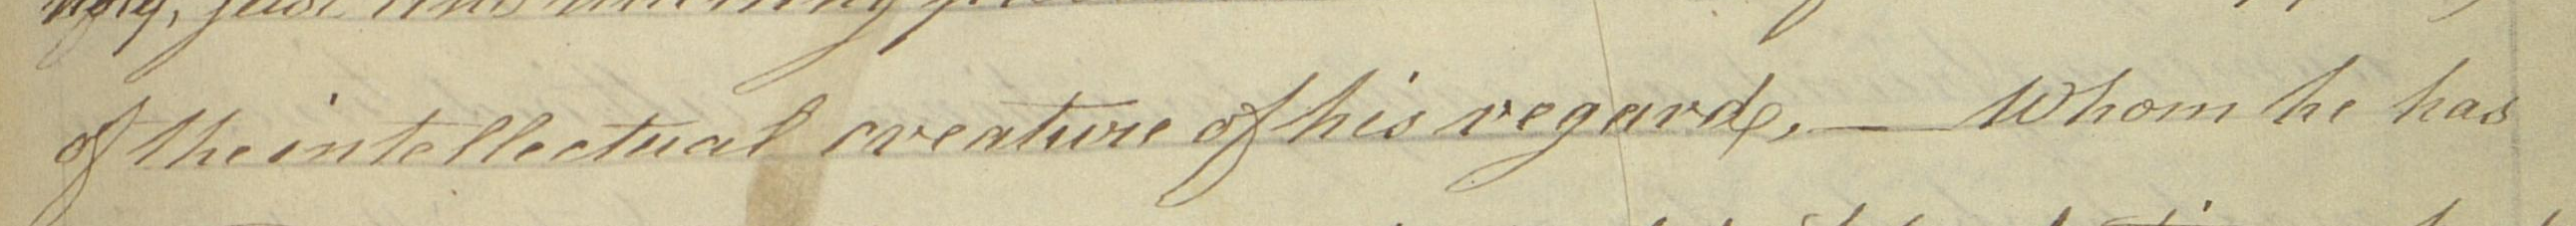of the intellectual creature of his regard, Whom he has
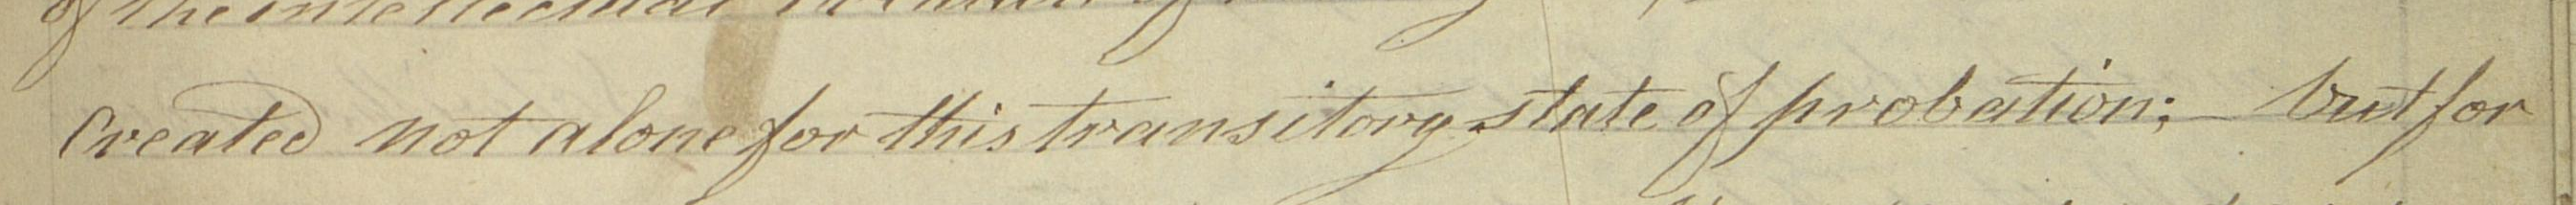created not alone for this transitory state of probation; but for
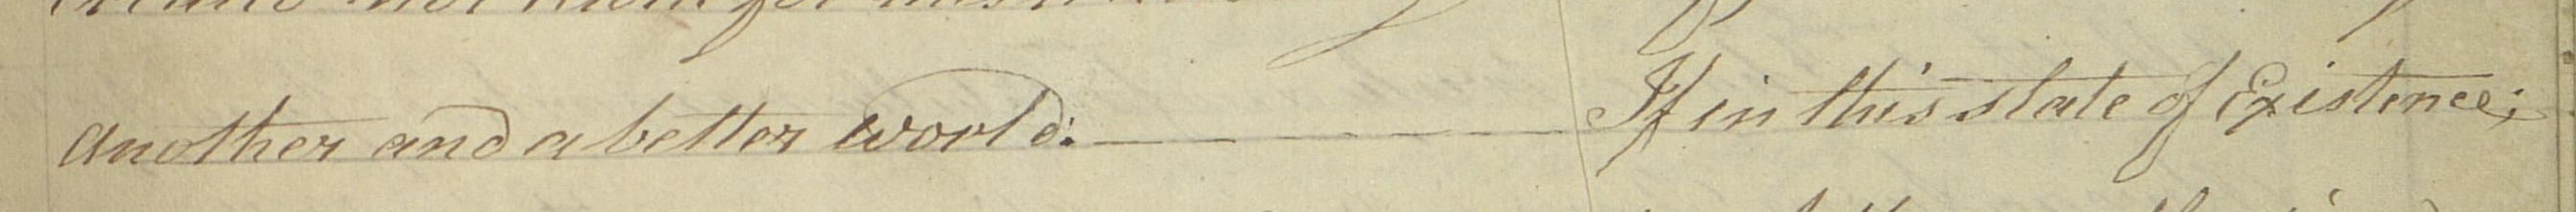another and a better world. If in this state of Existence;
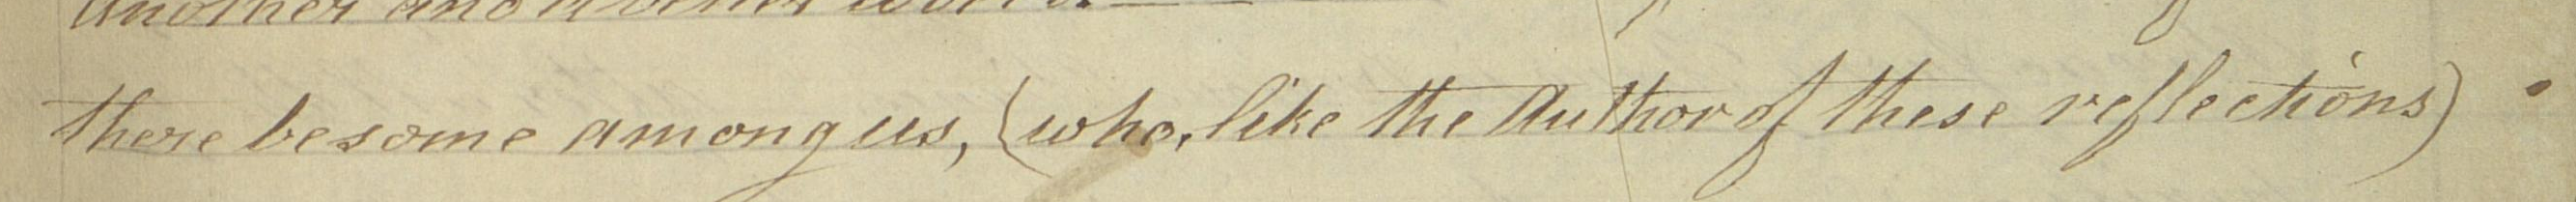there be some among us, (who like the Author of these reflections)
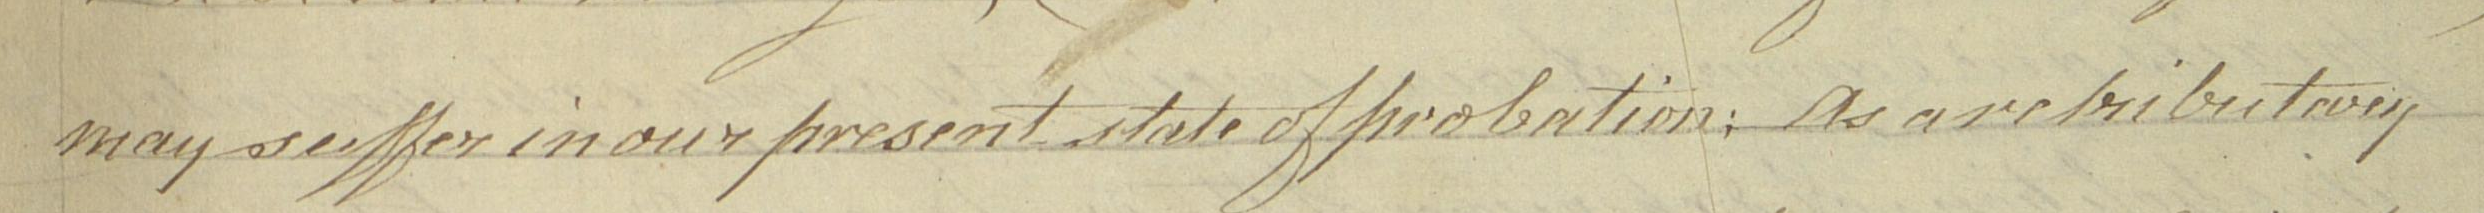may suffer in our present state of probation; As a retributary
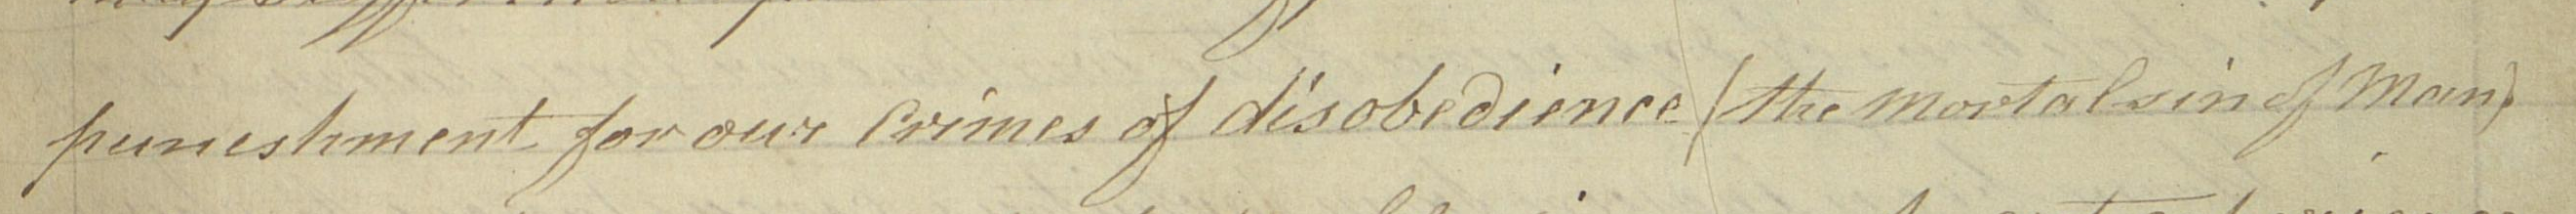punishment for our Crimes of disobedience (the mortal sin of Man.)
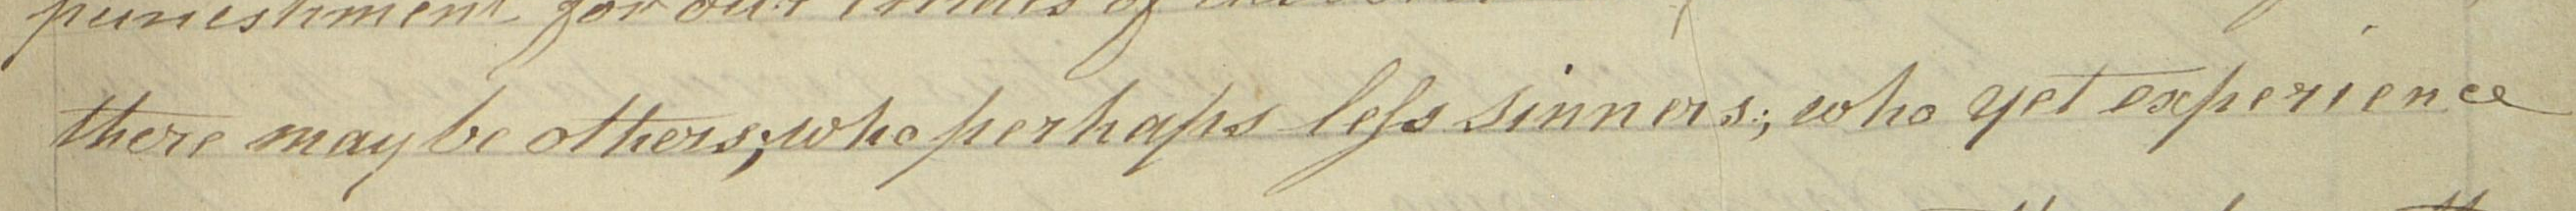there may be others; who perhaps less sinners; who yet experience
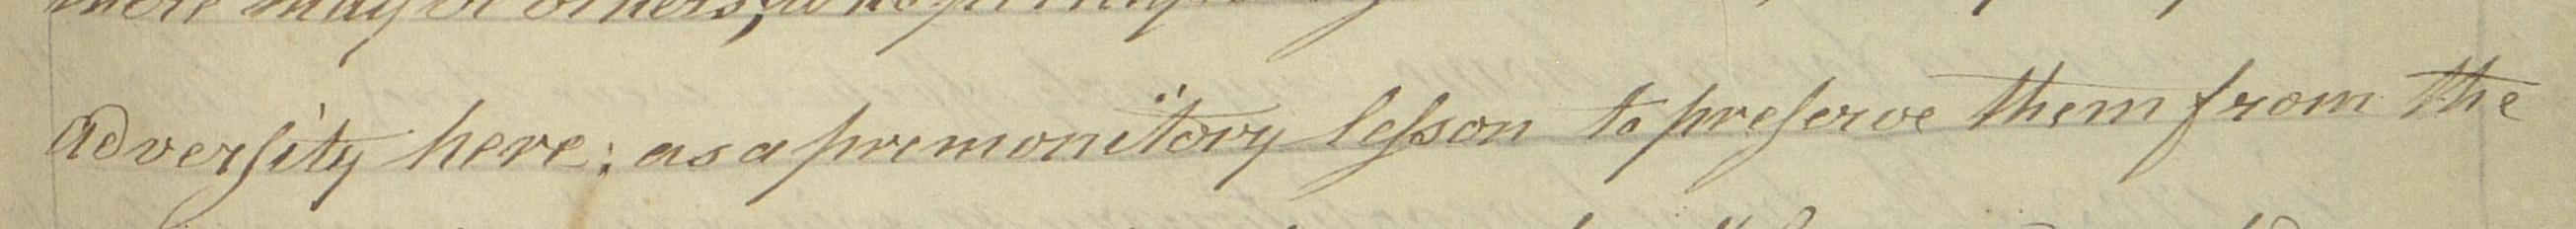adversity here; as a premonitory lesson to preserve them from the
